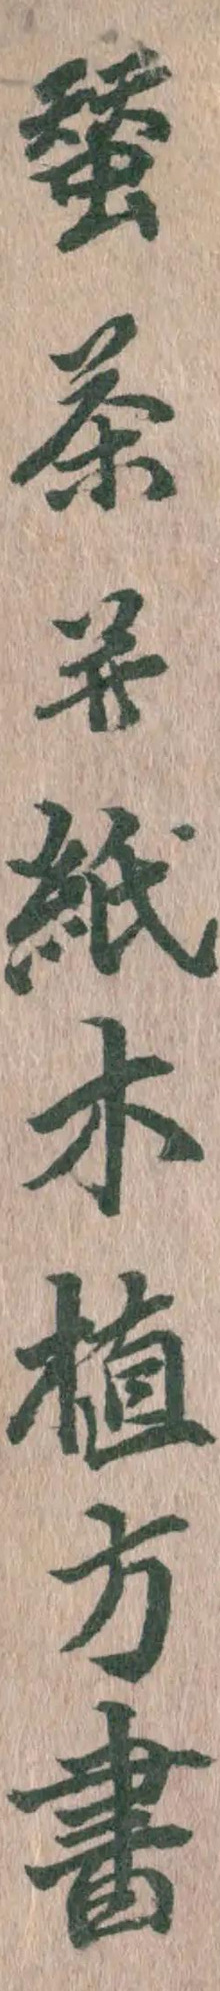蚕茶并紙木植方書

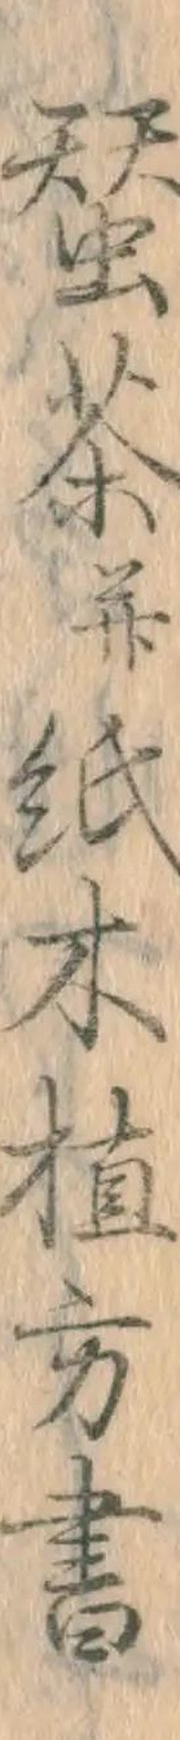蚕茶並紙木植方書
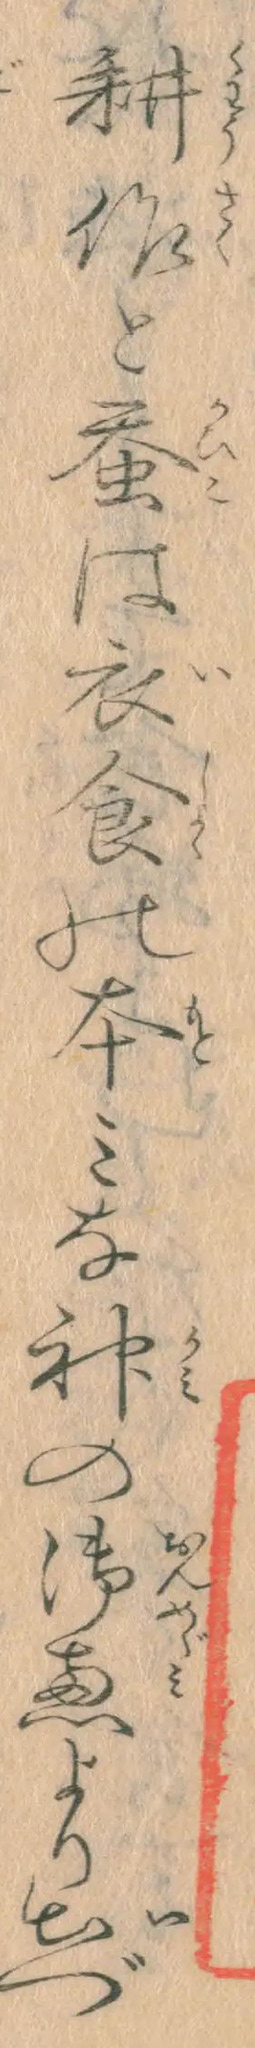耕作と蚕は衣食の本みな神の御恵より出づ
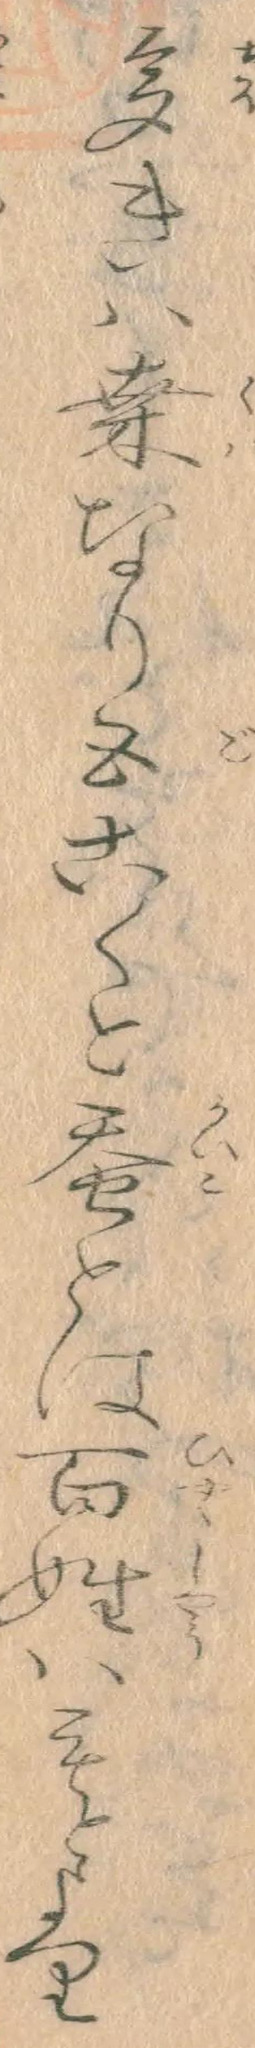多きは桑なり五こくと蚕とは百姓はもとより
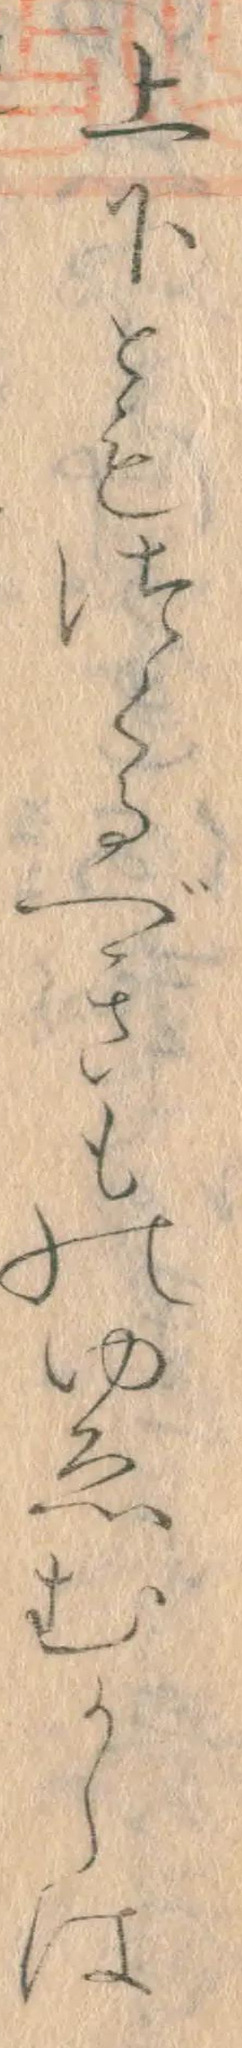上下ともつくるべきものゆゑむかしは
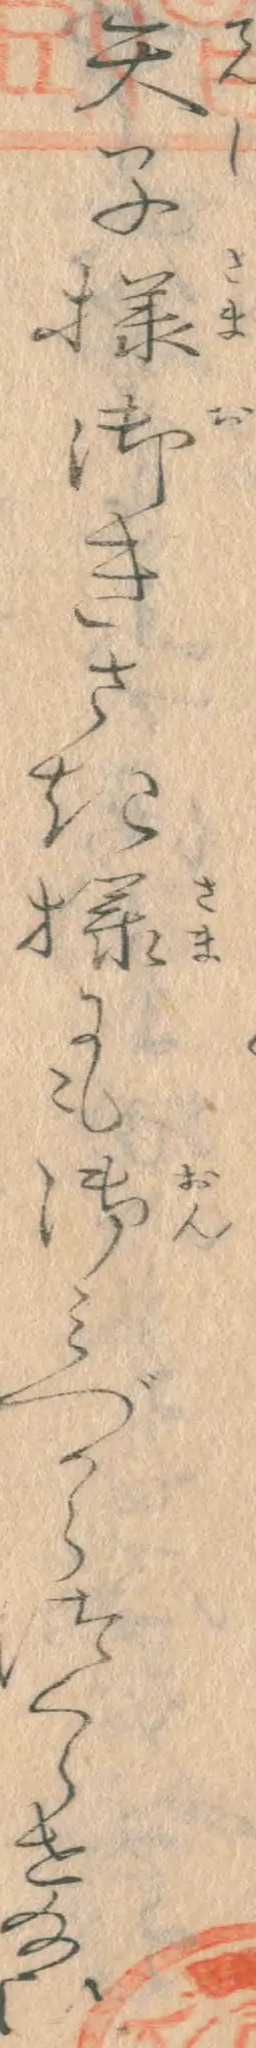天子様御きさき様も御みづからつくらせ給い
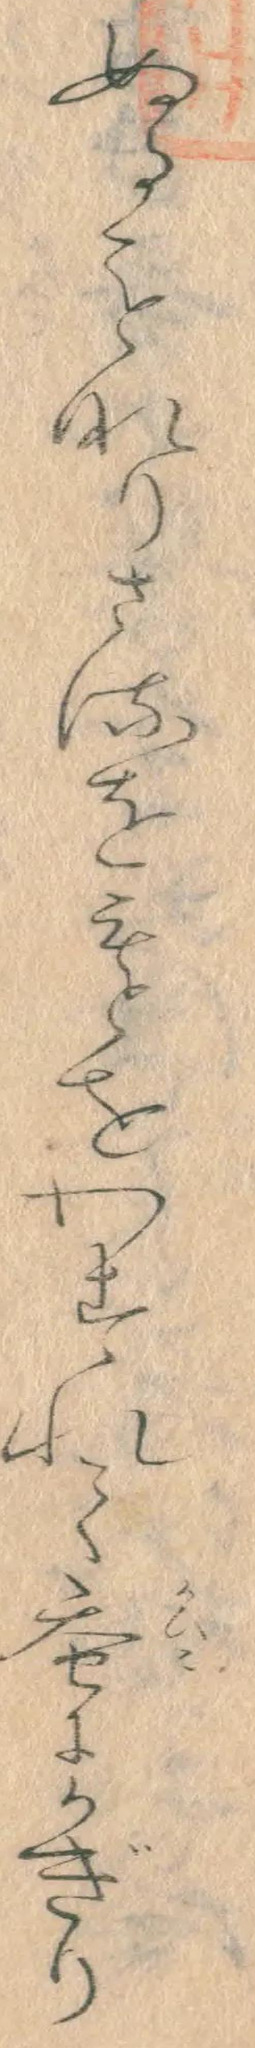ぬることなりさるをもとをわすれて蚕にかぎり
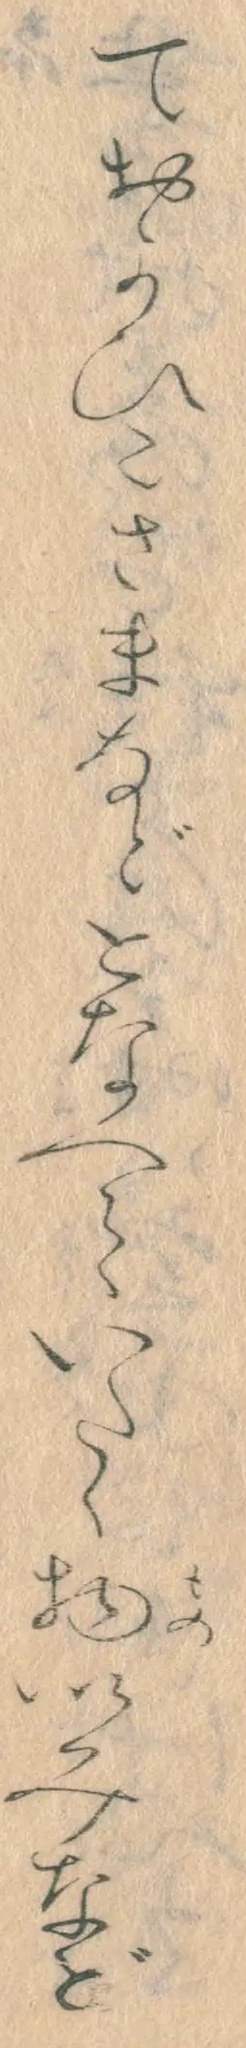ておかひこさまなどとなへていたく物いみなど
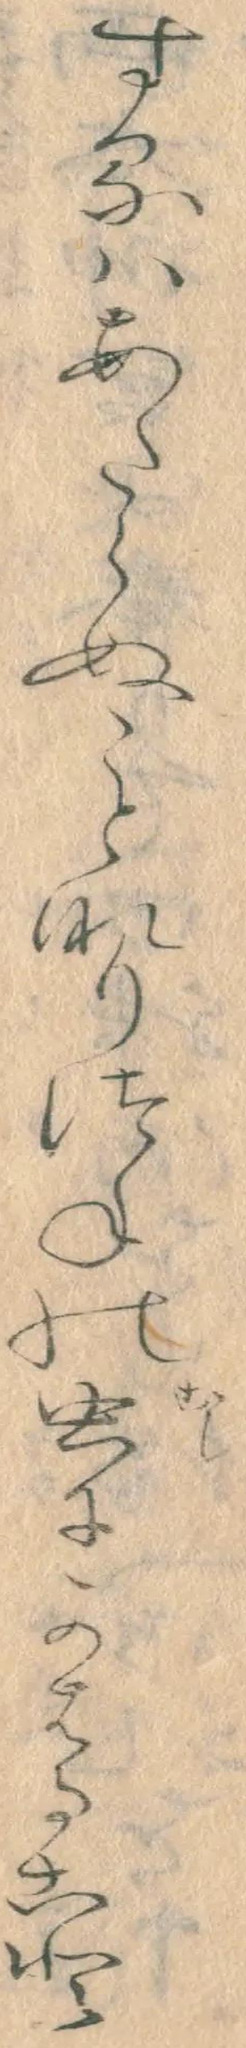するはあたらぬことなりつねの虫にかはること
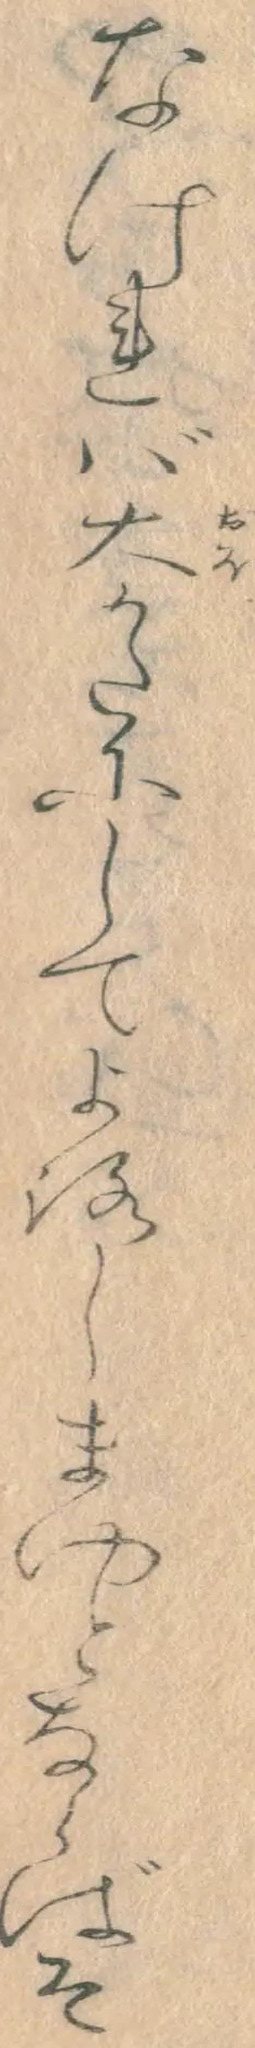なければ大かたにしてよろしまゆとならばそ

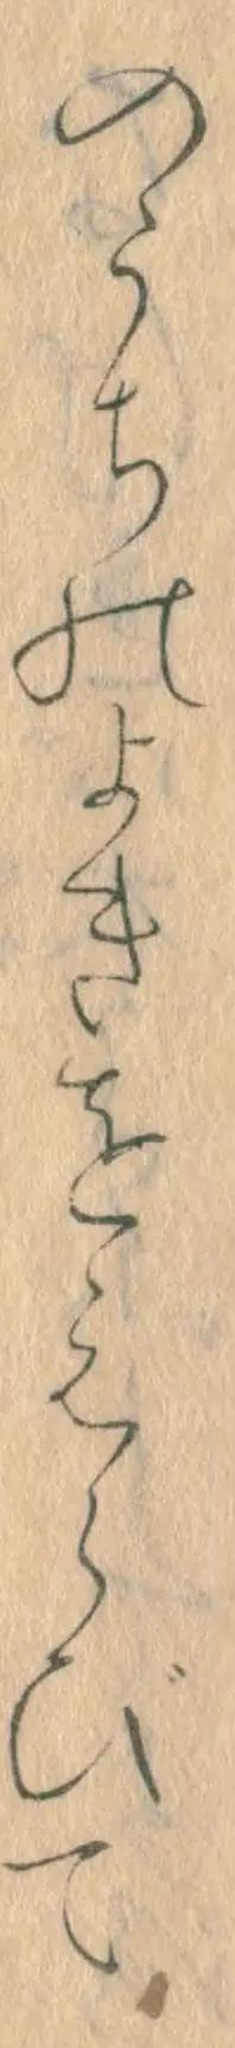のうちのよきをえらびて
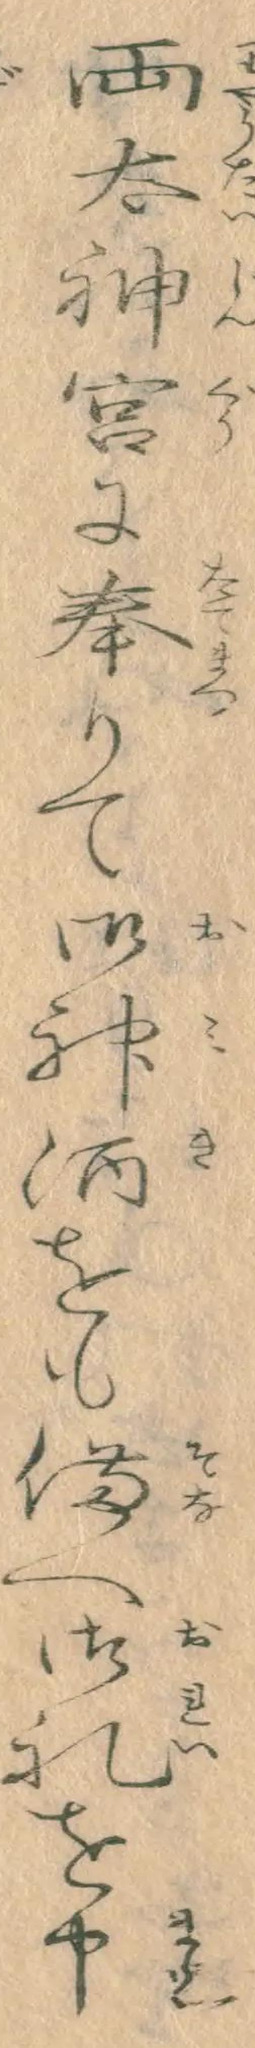両太神宮に奉りて御神酒をも備へ御礼を申
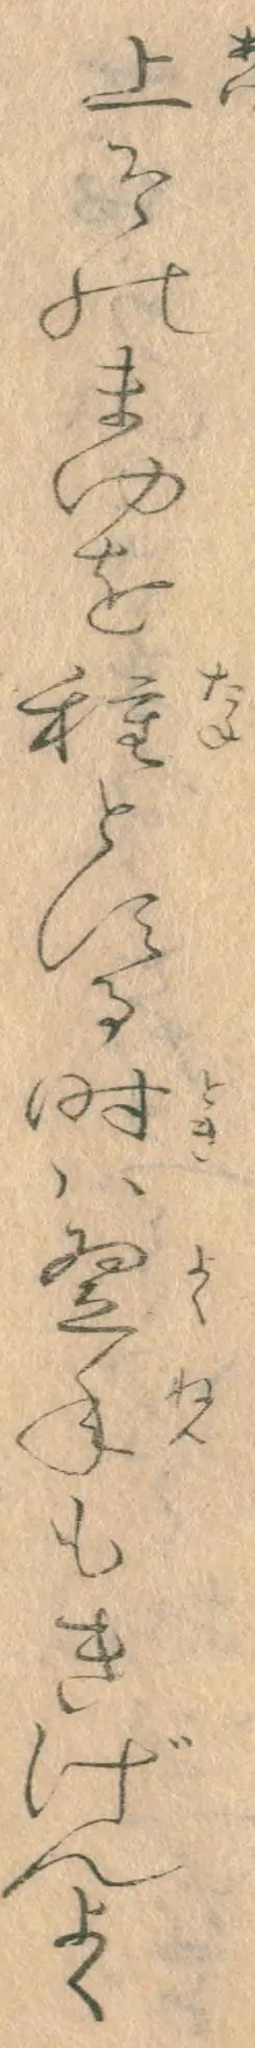上そのまゆを種とする時は翌年もきげんよく
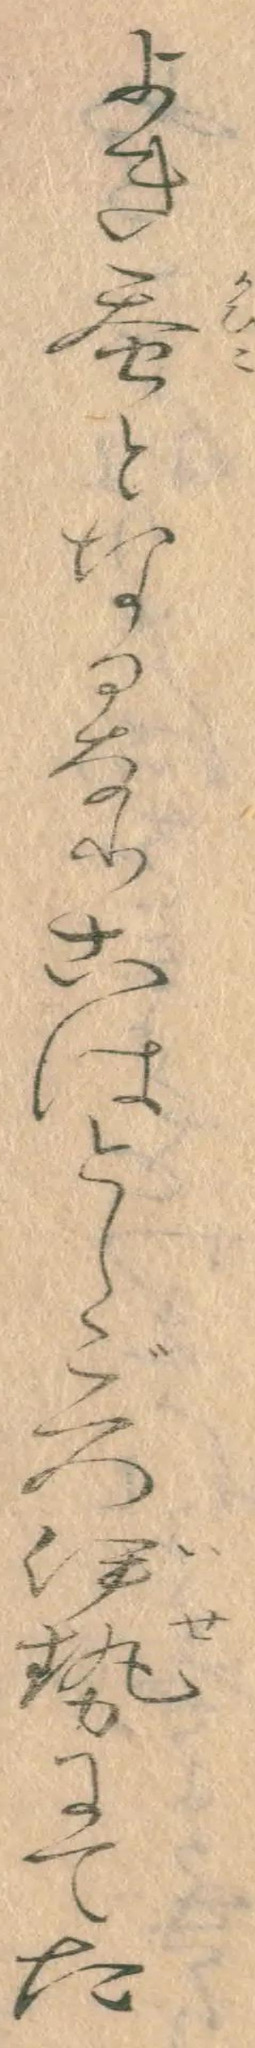よき蚕となるなりこはとしごろ伊勢にてた
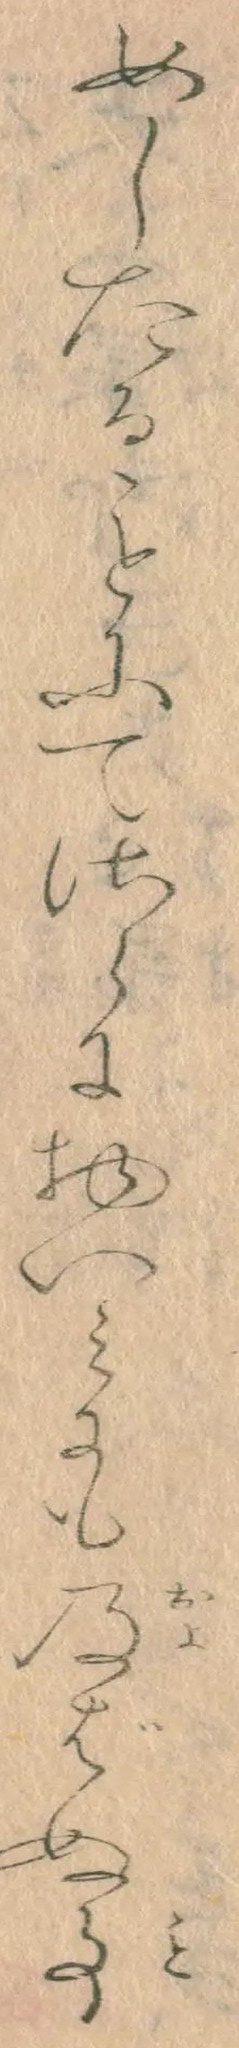めしたることにてさらに物いみにも及ばぬ事
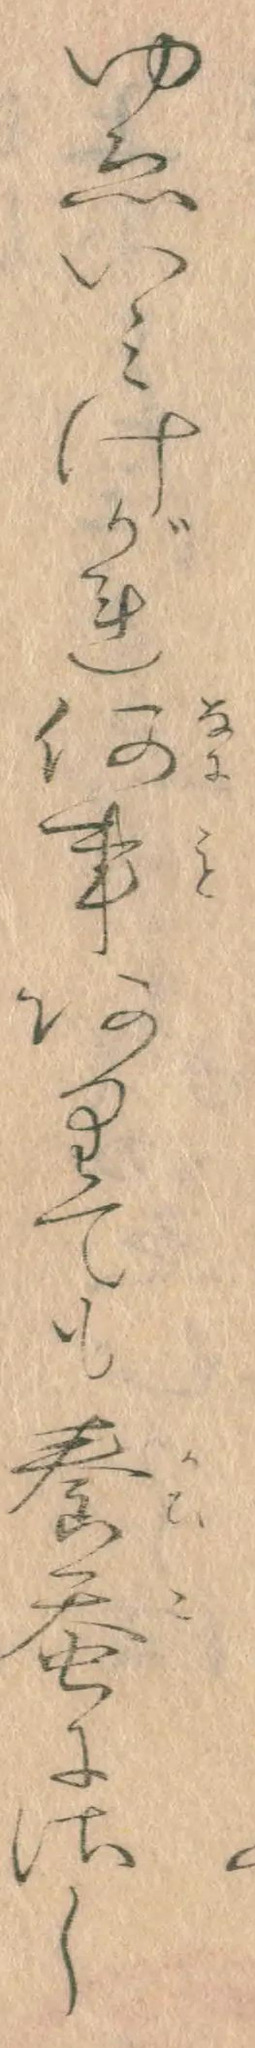ゆゑいみけがれ何事ありても養蚕にさし
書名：蚕茶并紙木植方書
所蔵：国立国会図書館 National Diet Library, JAPAN
